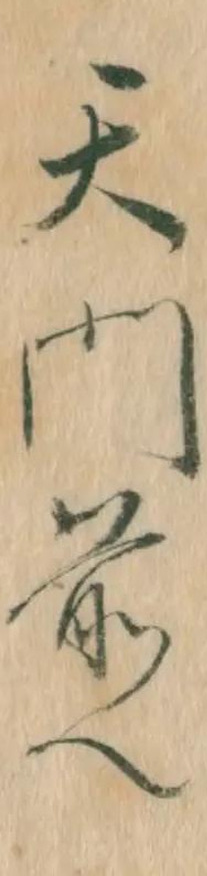天門前へ
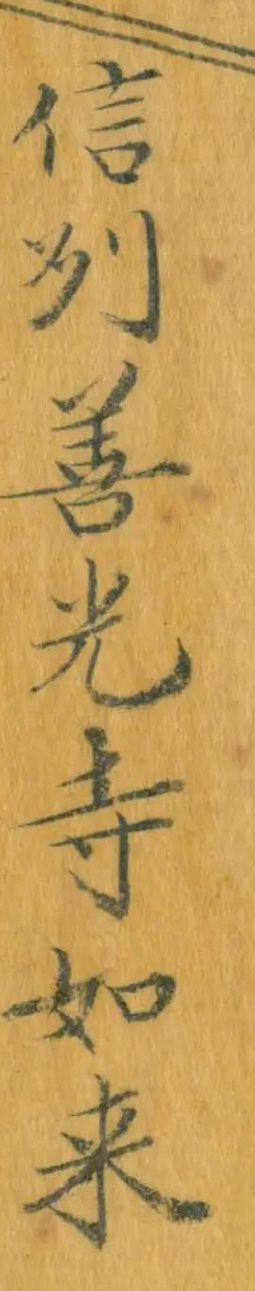信州善光寺如来
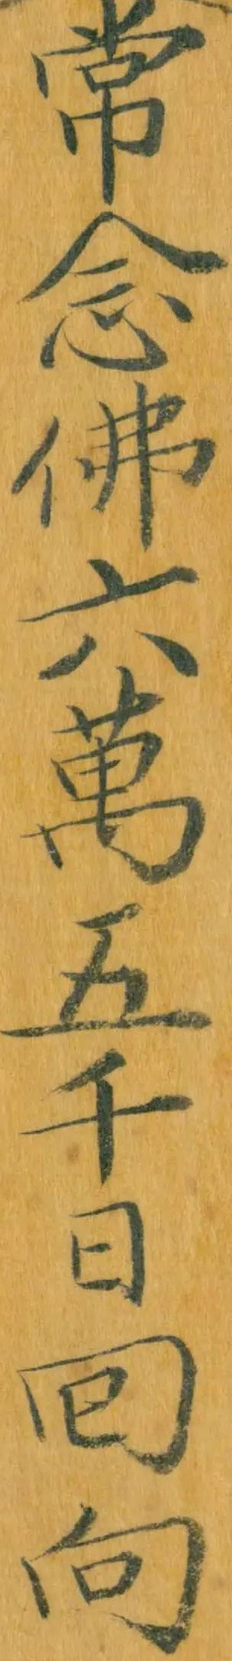常念仏六万五千日回向
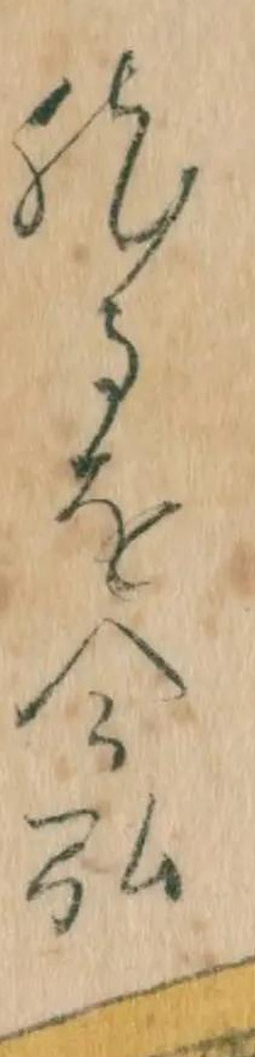然るを今弘
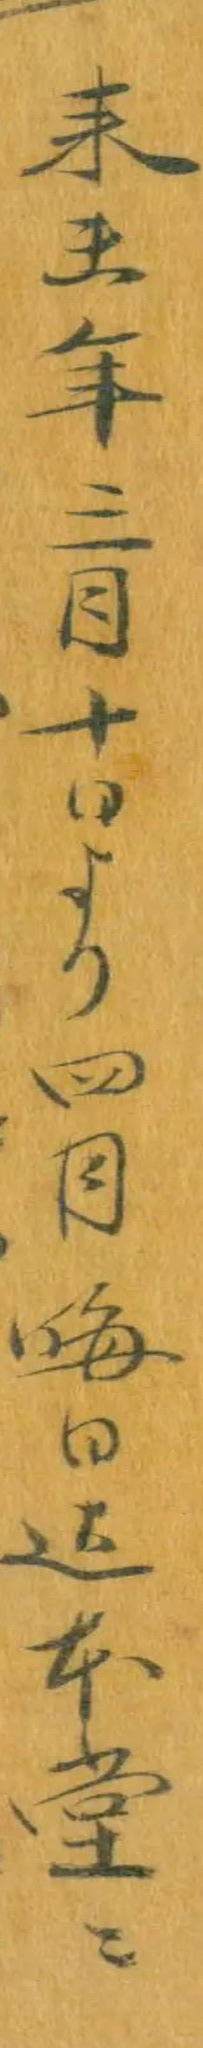来未年三月十日より四月晦日迄本堂に
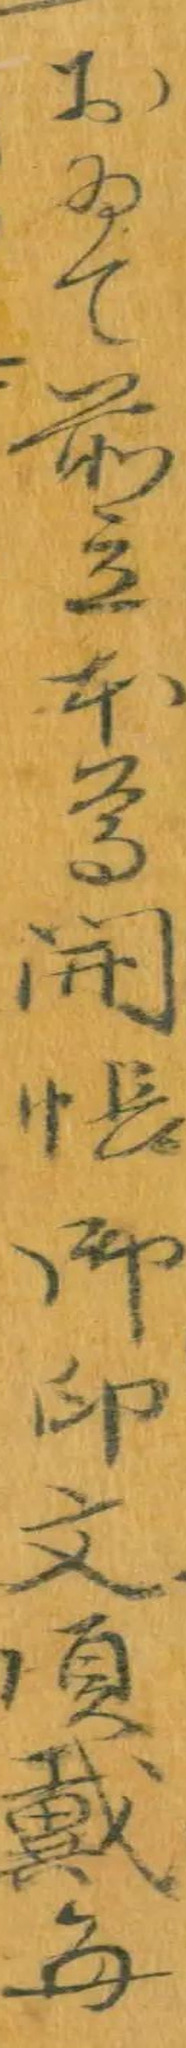おゐて前立本尊開帳御印文頂戴毎
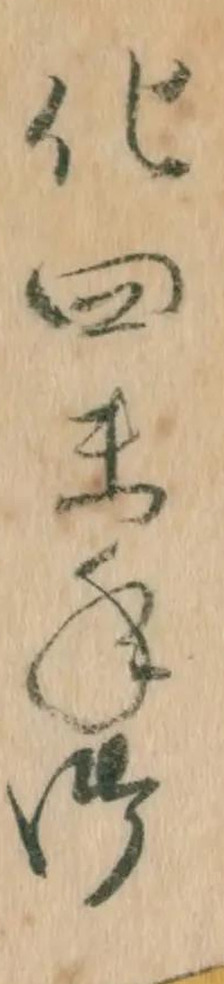化四未年御
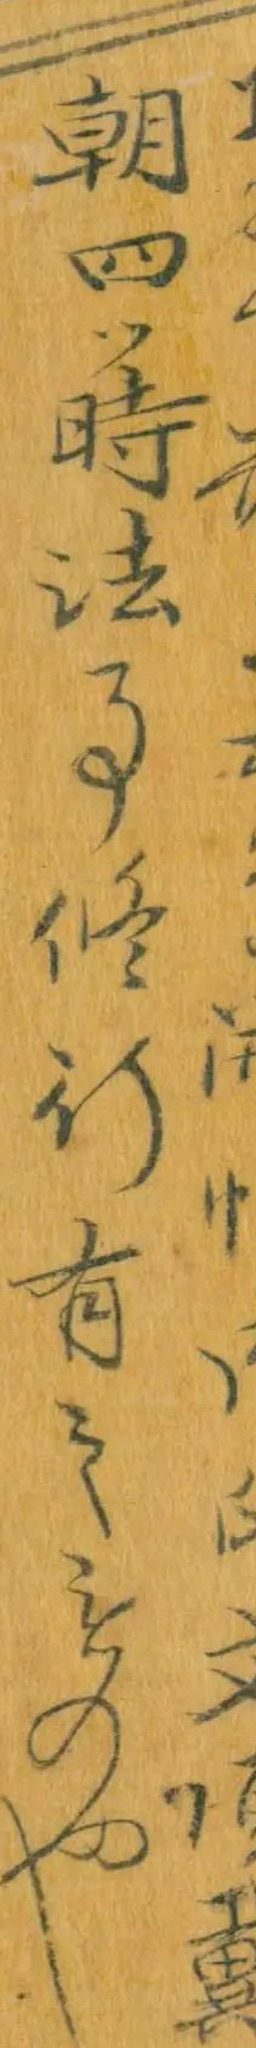朝四ッ時法事修行有之もの也
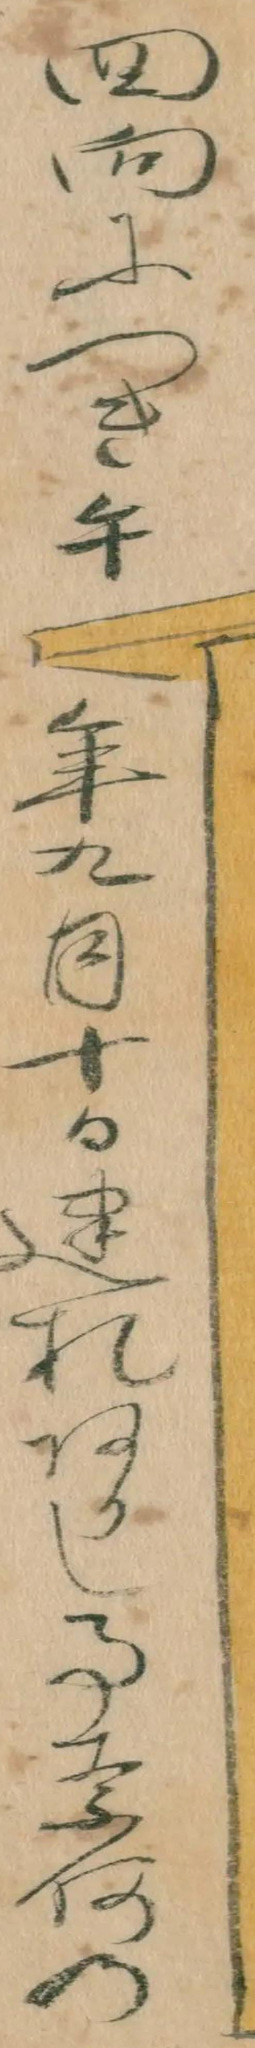回向につき午年九月十日建札ありし事奈何の
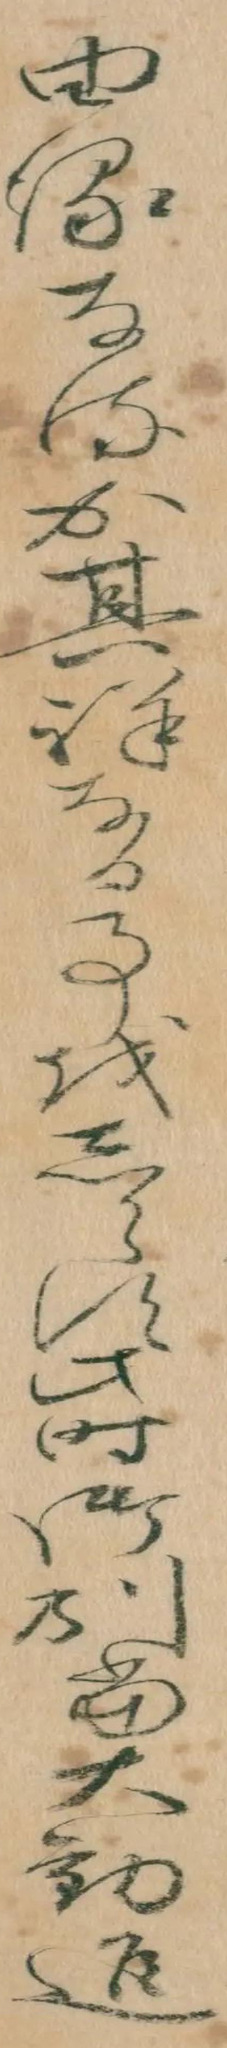由縁なるか其詳なる事をしらす此時御別当大勧進
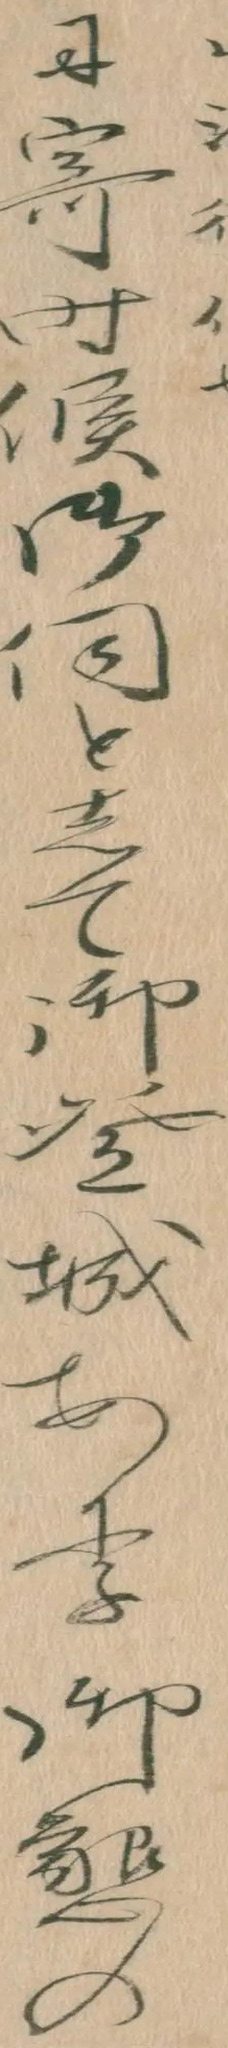に寄時候御伺として御登城あり御懇の
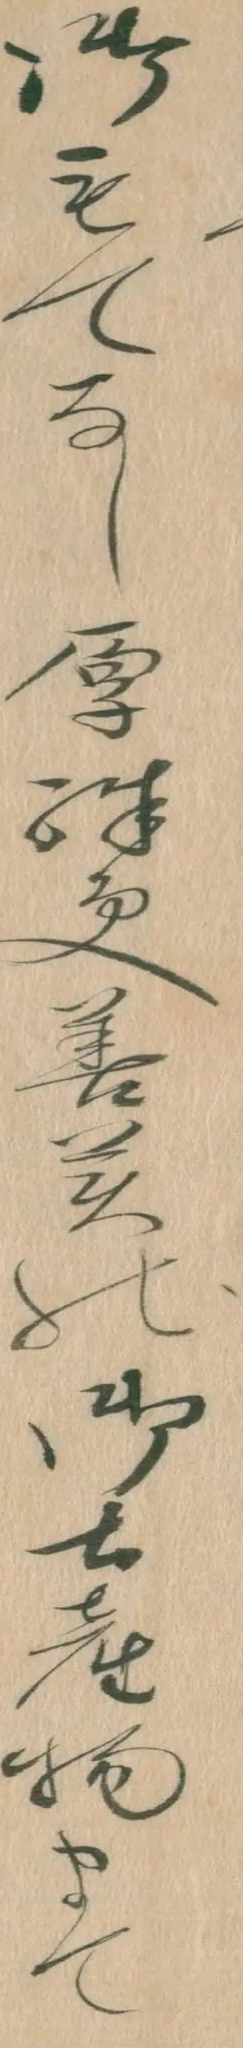御もてなし厚善美の御土産物まて
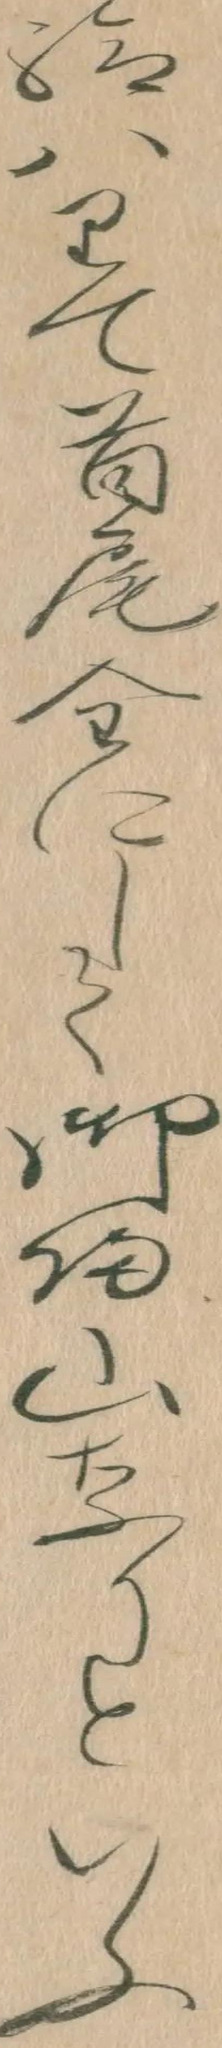給はりて首尾全にして御帰山奈りといふ
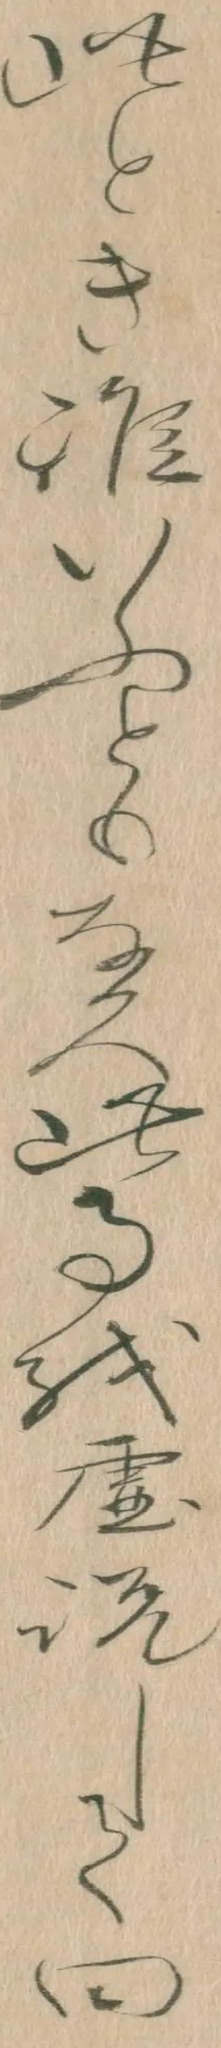此とき誰いふともなく此事を虚説して曰
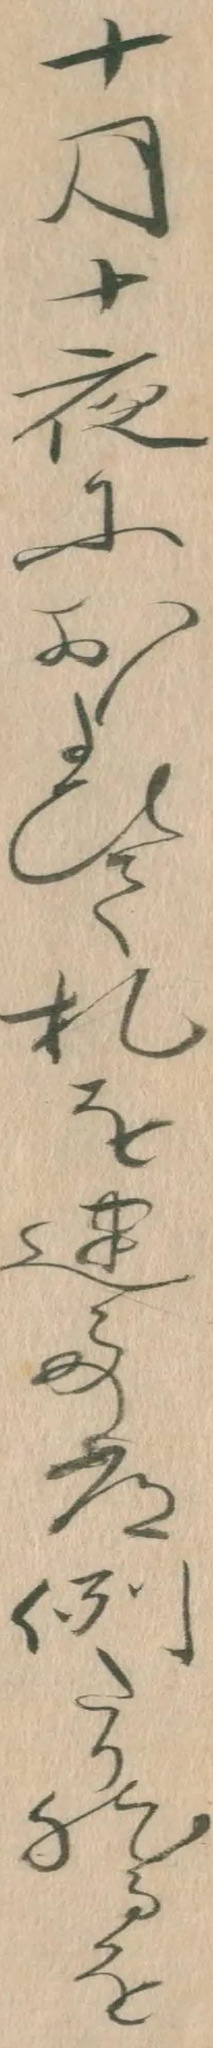十月十夜におよひて札を建事常例たり然るを
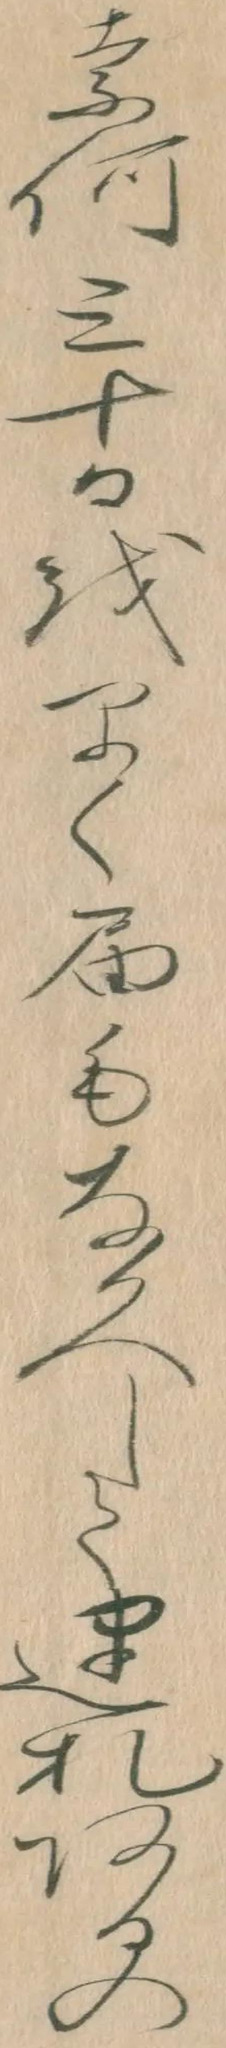奈何三十日をなく届もなくして建札あるの
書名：俗語之種. [1]
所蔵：国立国会図書館 National Diet Library, JAPAN
